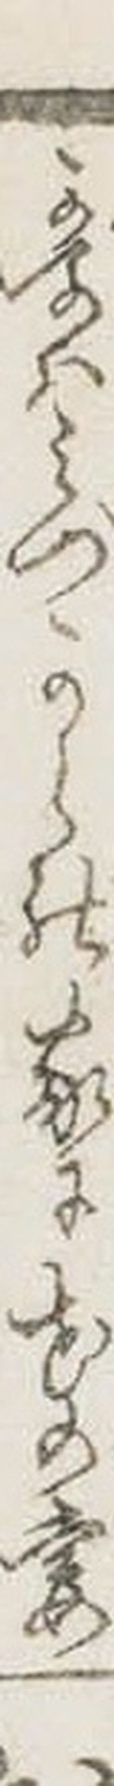哥はみづからの家に花の宴
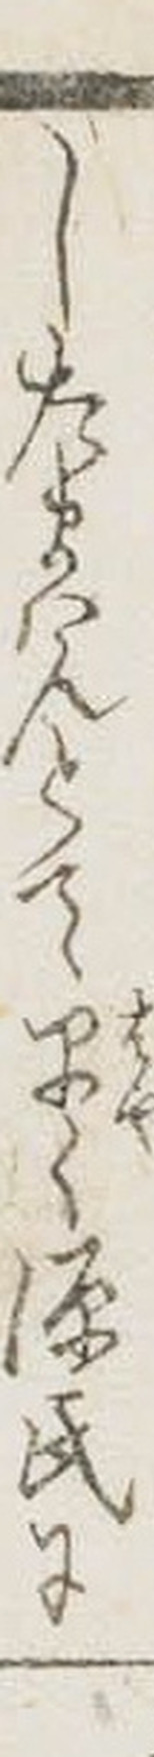したまはんとて早く源氏に
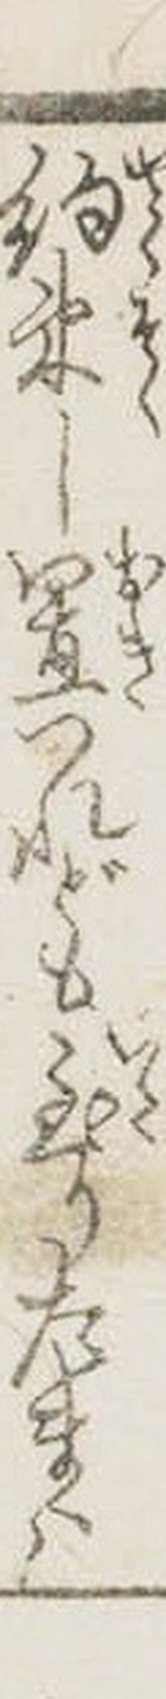約束し置つれども至りたまは
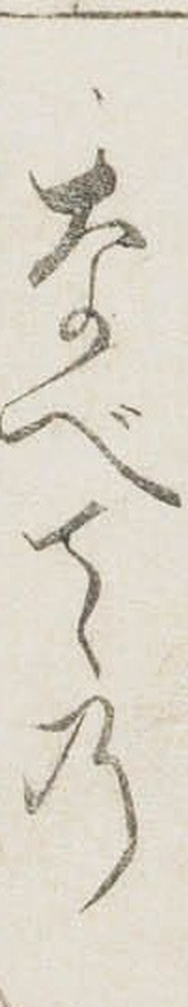なべての
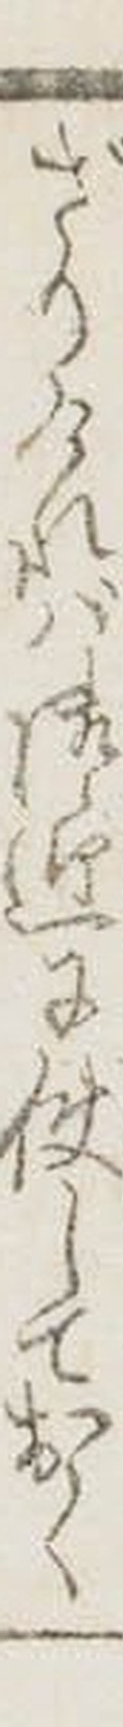ざりければ御迎に使しておく
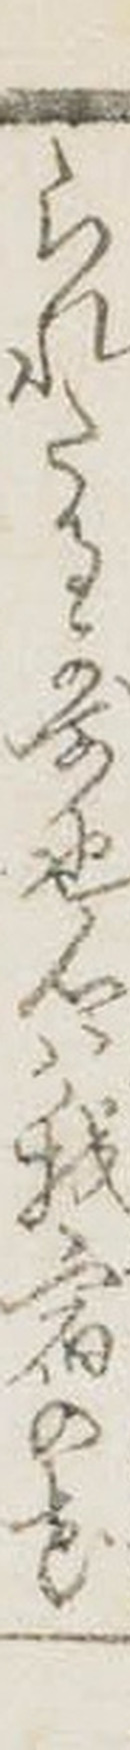られたる哥也心は我宿の花
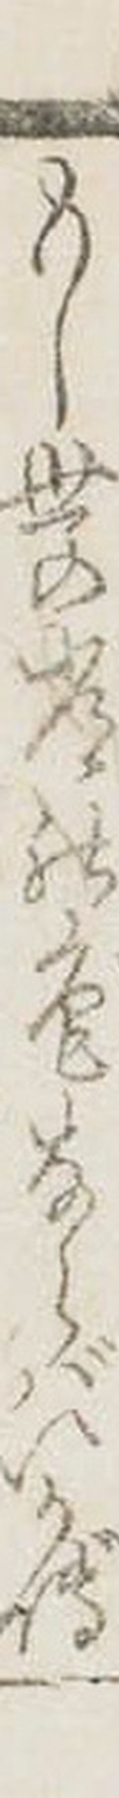もし世の常の色ならばいかで
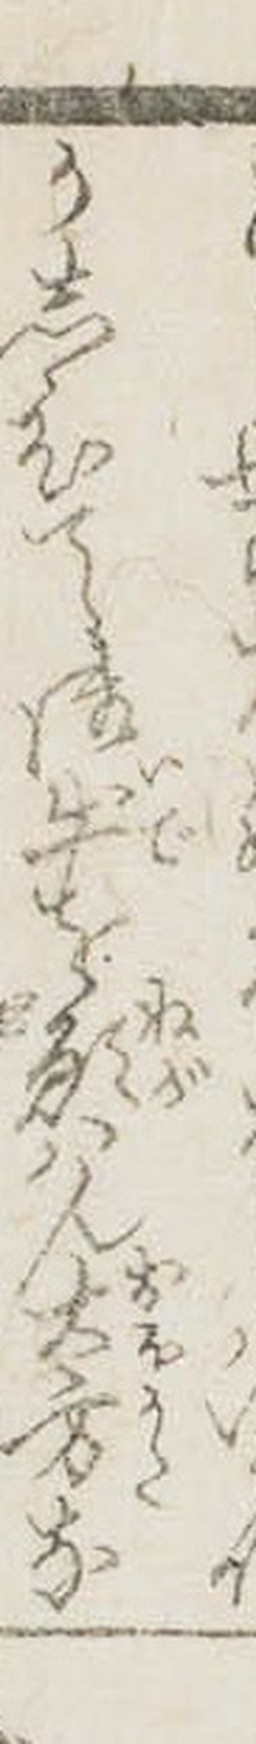かしひて御出を願はん大方な
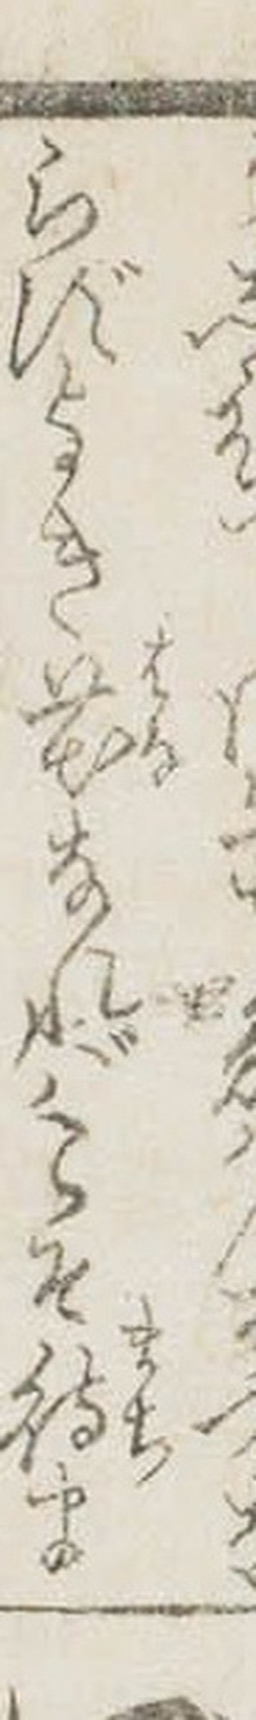らずよき花なればこそ待ま
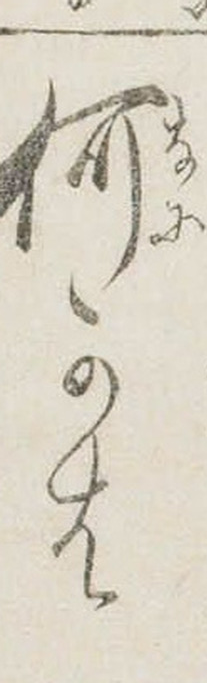何かは
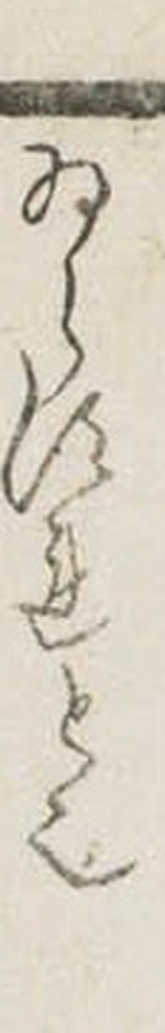ゐらすれと也
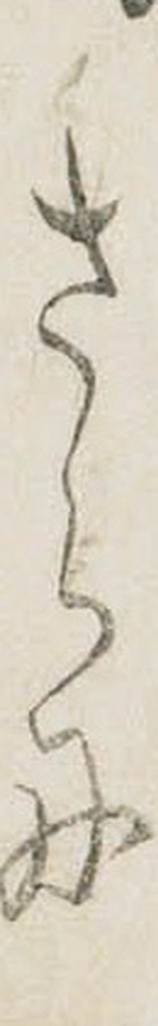さらに

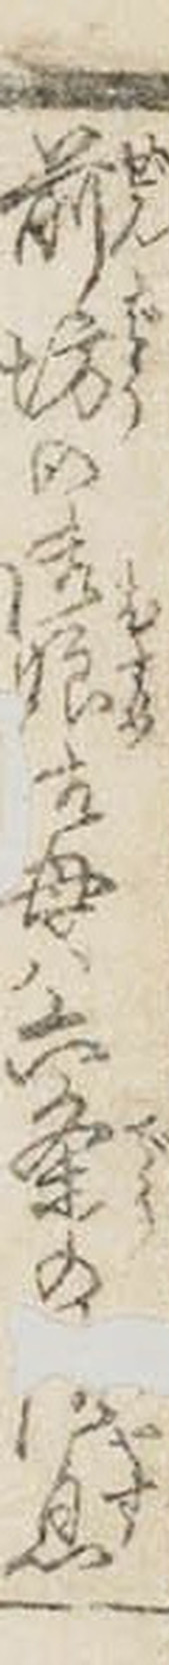前坊の御娘御母は六条の御息
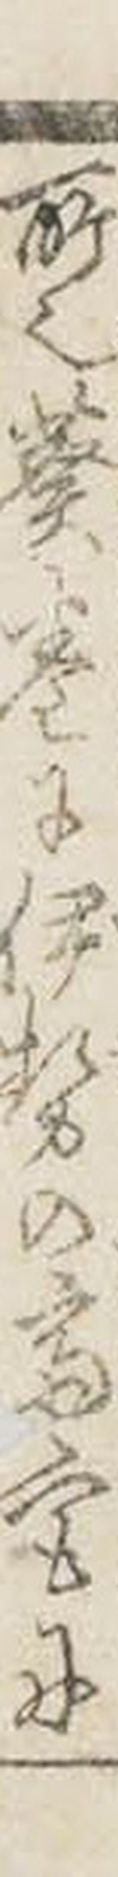所也葵巻に伊勢の斎宮に
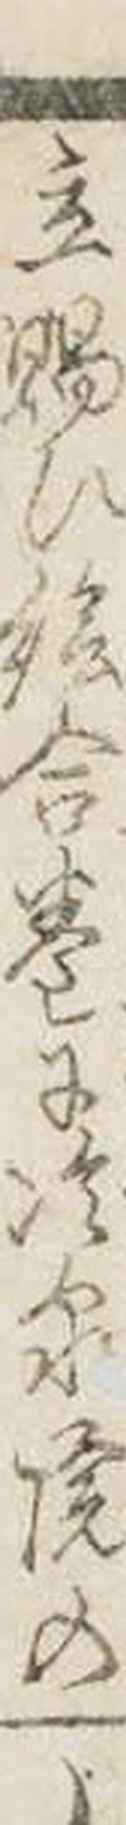立賜ひ絵合巻に冷泉院の
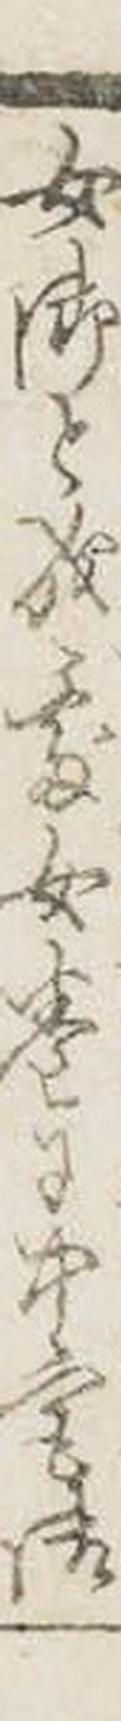女御と成処女巻に中宮御
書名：源氏百人一首
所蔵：東京学芸大学教育コンテンツアーカイブ
